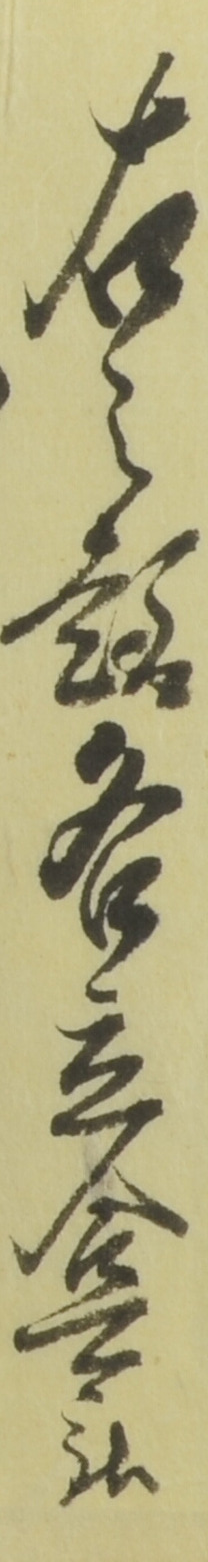右之趣各立合可被
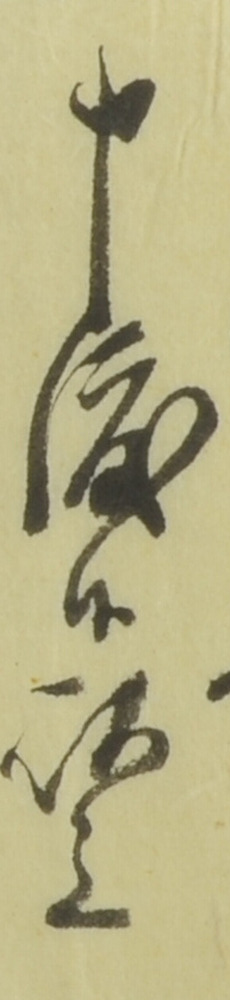申渡候以上
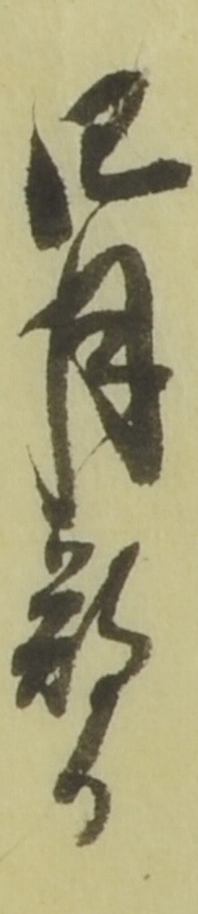四月朔日
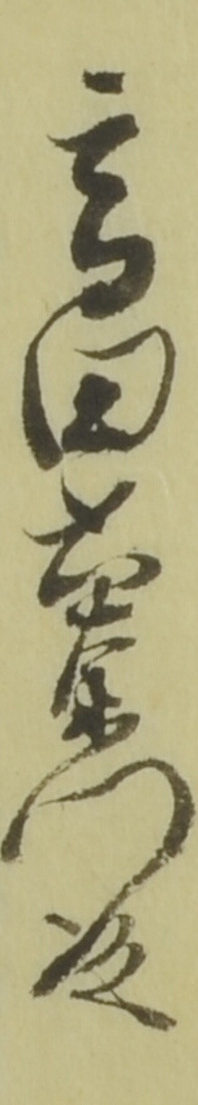高田六右衛門殿
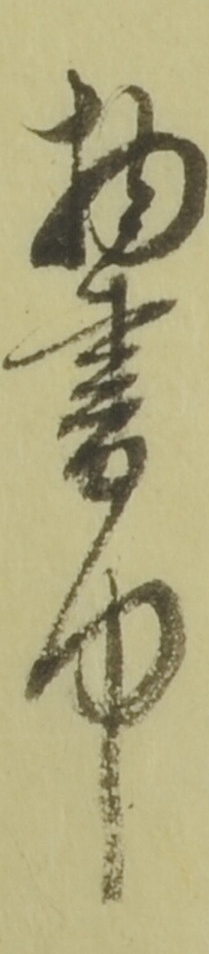物書中
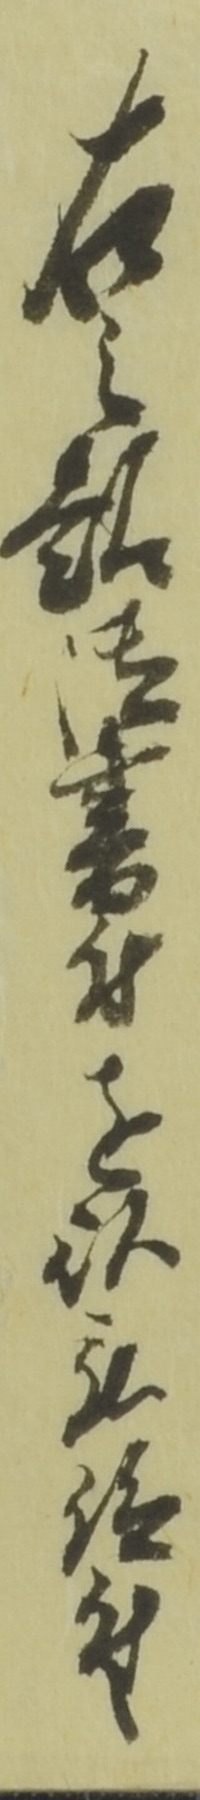右之趣御書付を以被仰付候
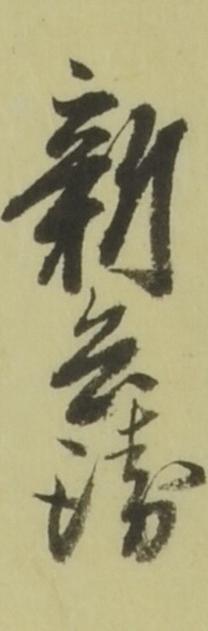新兵衛
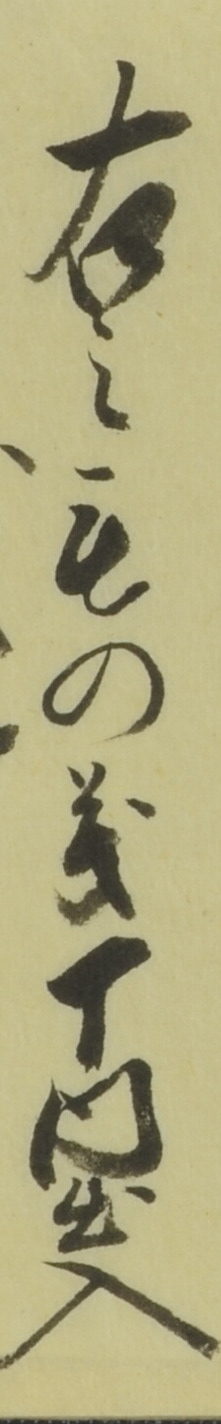右之もの義丁内出入
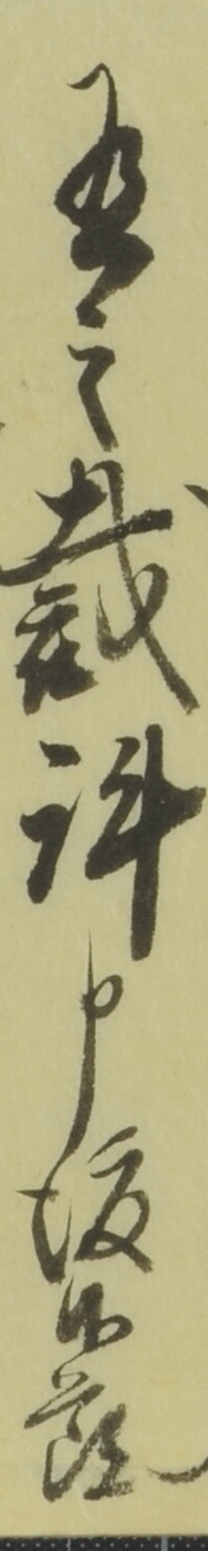有之裁許申渡候節
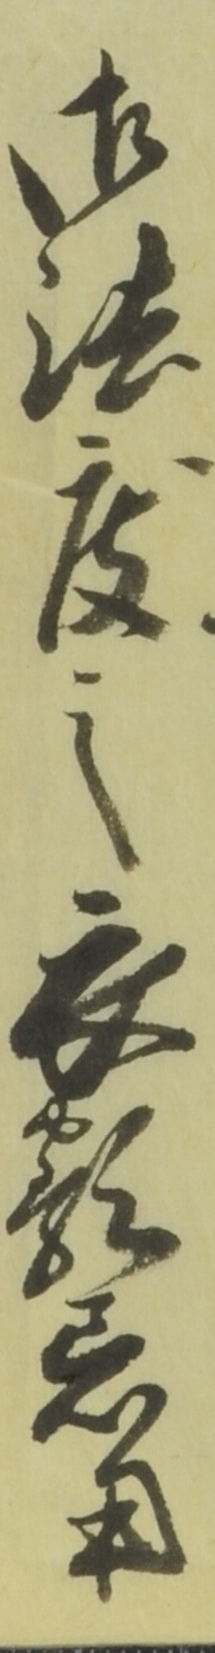御法度之衣類着用

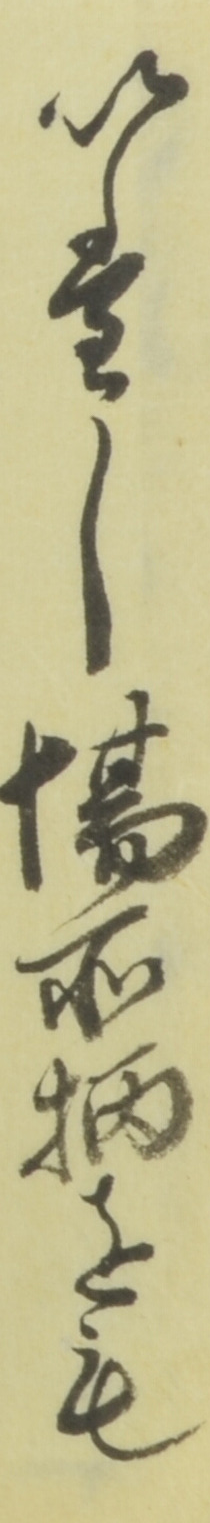いたし場所柄をも
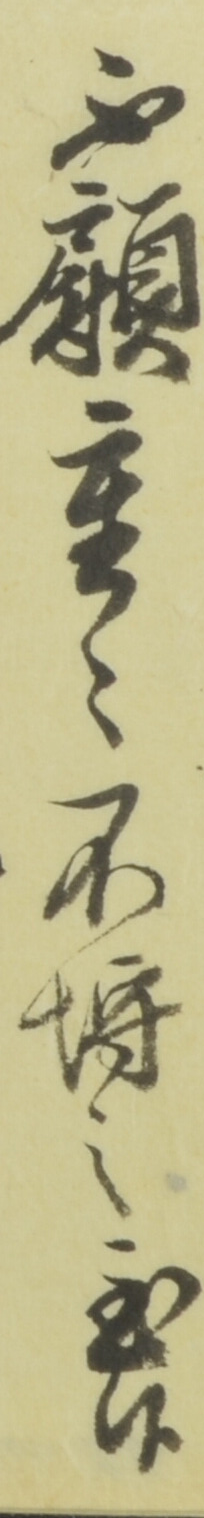不顧重々不埒之至候
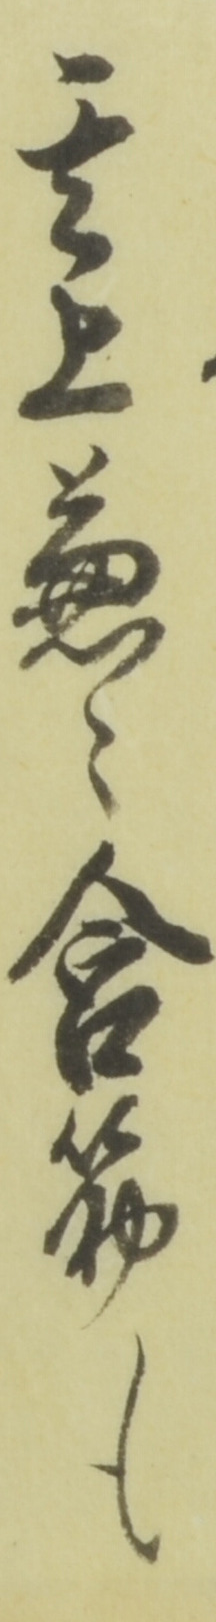其上兼々含筋も
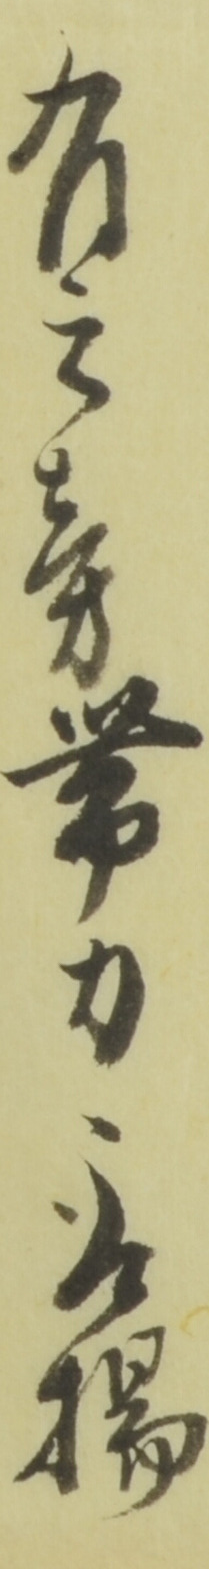有之旁帯刀取揚
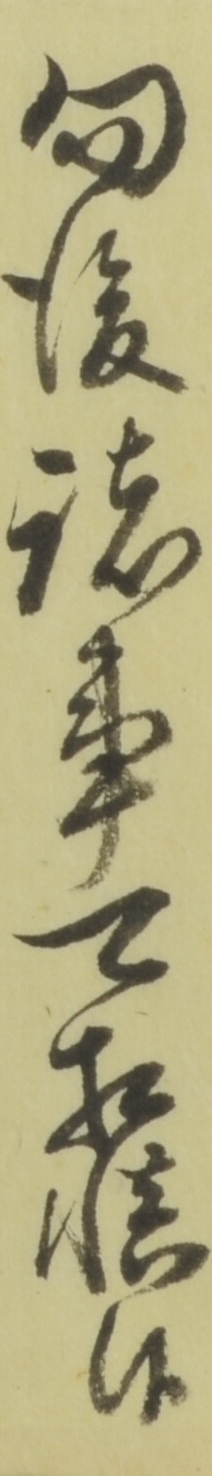向後諸事可相慎候
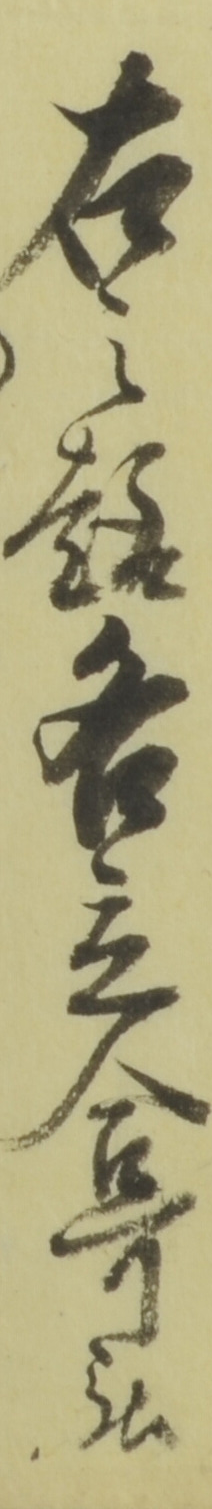右之趣各立合可被
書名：御触書御書附控
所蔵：伊那市立高遠町図書館・合同会社AMANE
